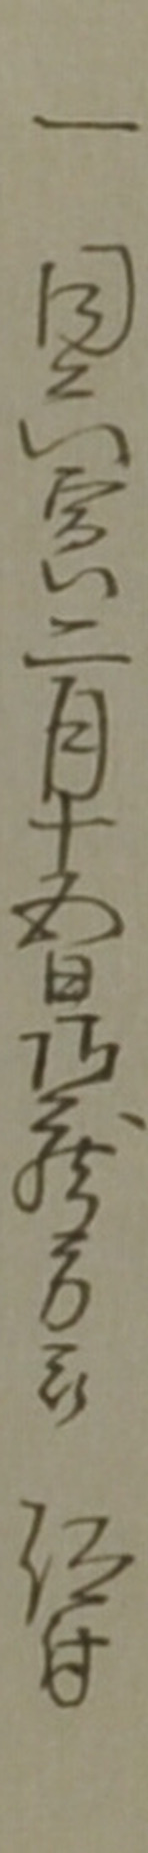一同六寅二月十五日御蔵方被仰付
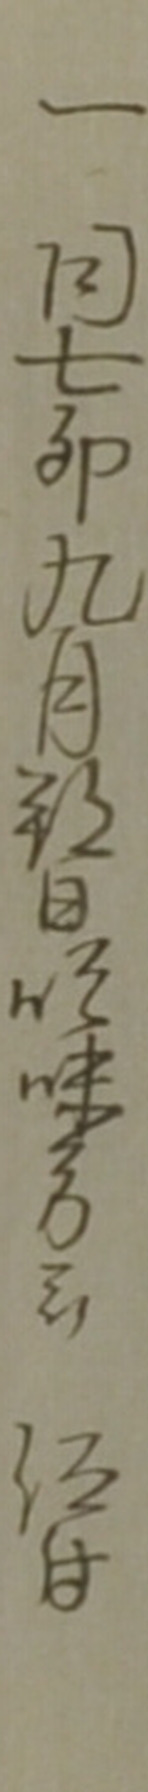一同七卯九月朔日吟味方被仰付
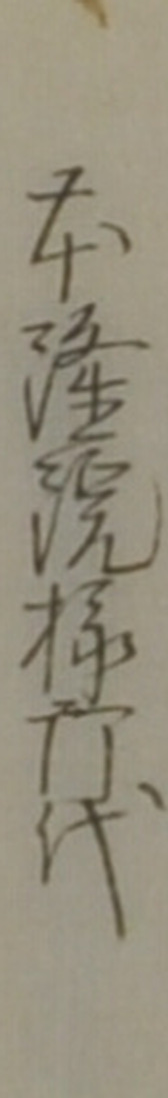本隆院様御代
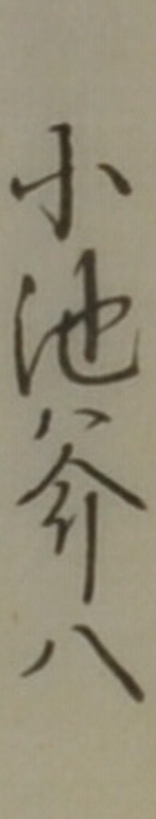小池斧八
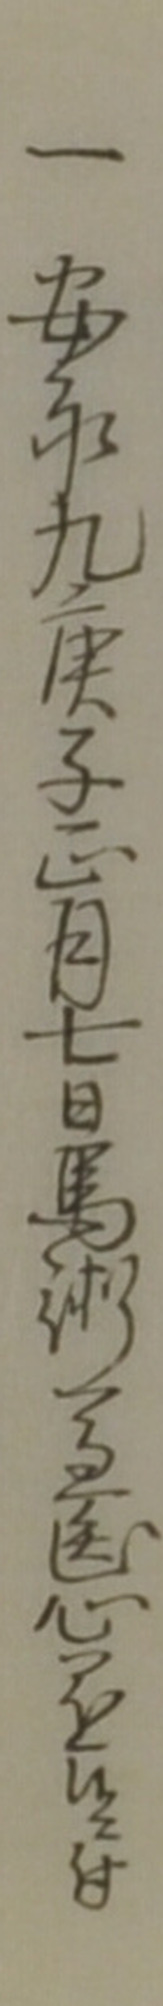一安永九庚子正月七日馬術馬医心懸候ニ付
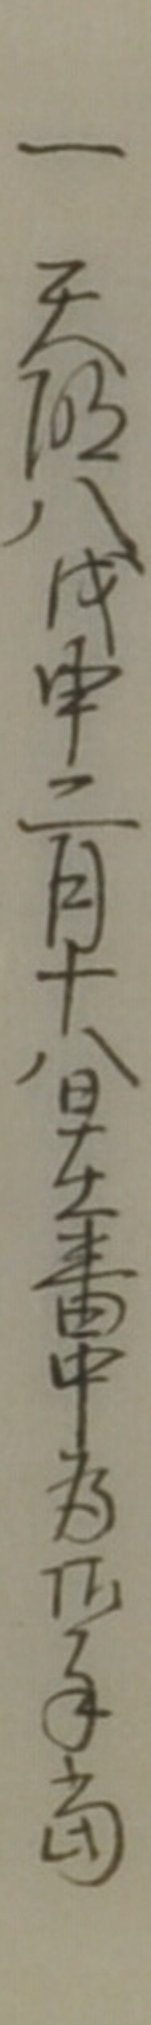一天明八戊申二月十八日在番中為御手当
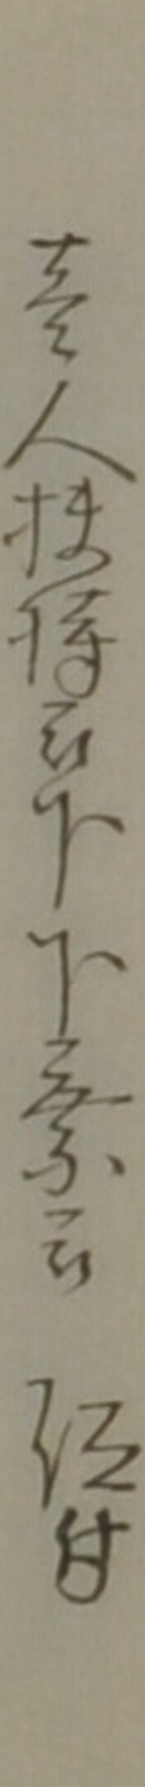壱人扶持被下下乗被仰付
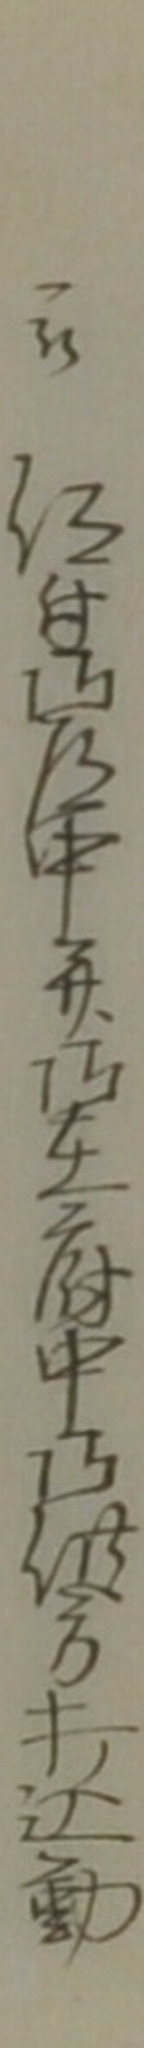被仰付御道中并御在府中御供方打込勤
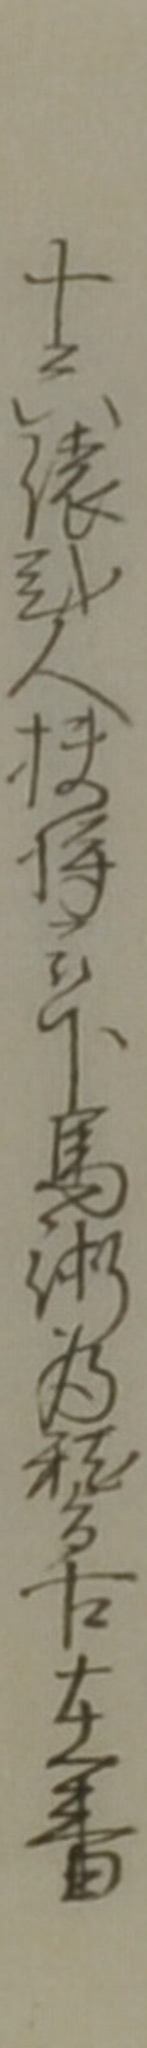十六俵弐人扶持被下馬術為稽古在番
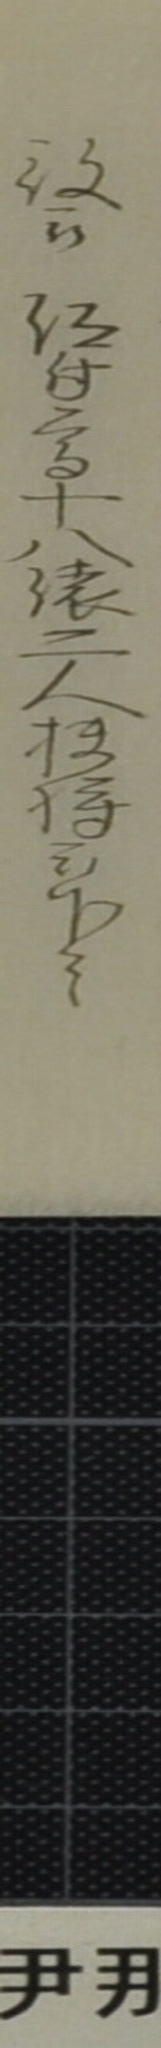役被仰付高十八俵二人扶持被下之
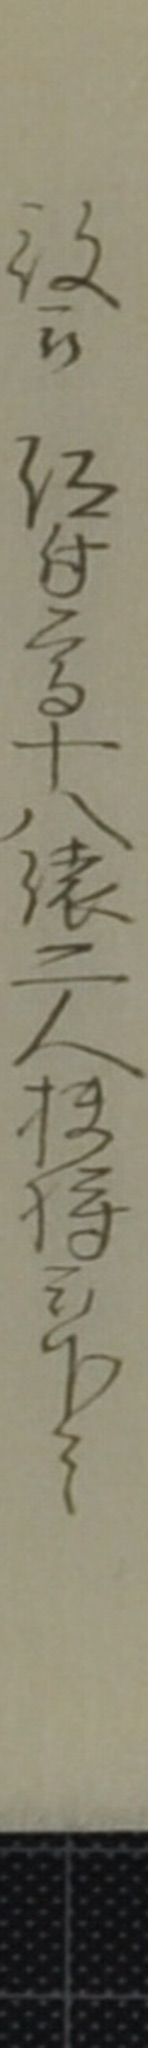役被仰付高十八俵二人扶持被下之
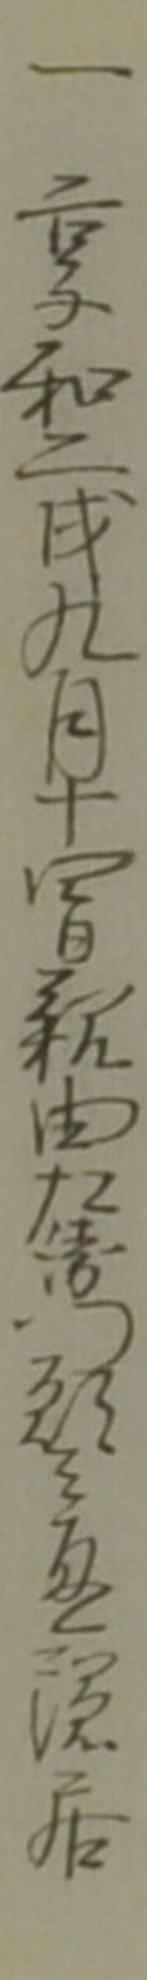一享和二戌九月十四日親由左衛門願之通隠居
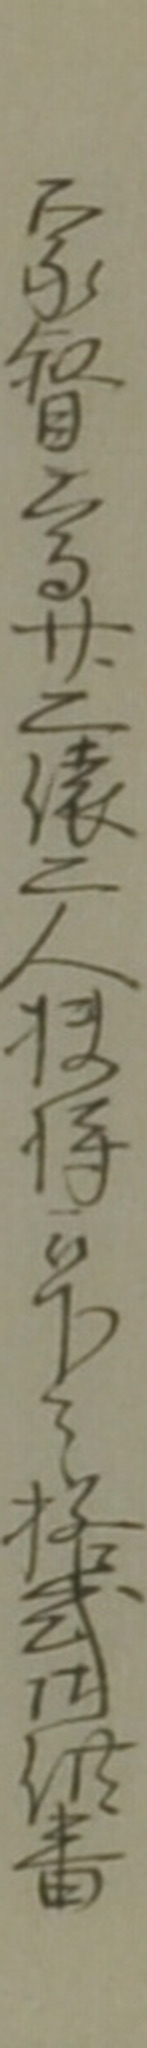家督高廿二俵二人扶持被下之格式御供番
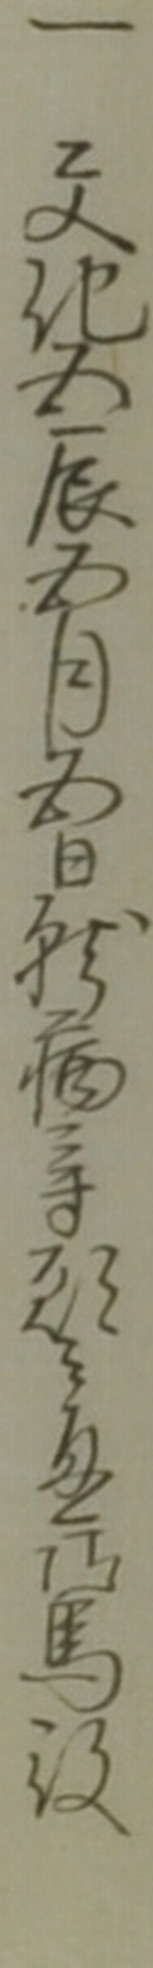一文化五辰五月五日就病気願之通御馬役
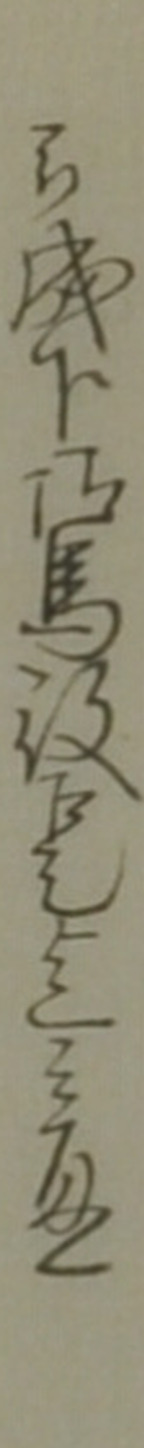被成下御馬役是迄之通
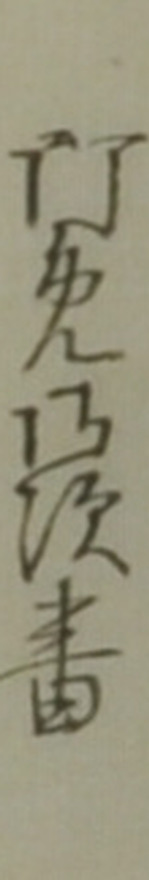御免御次番
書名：無足諸士勤仕録（五）
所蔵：伊那市立高遠町図書館・合同会社AMANE
